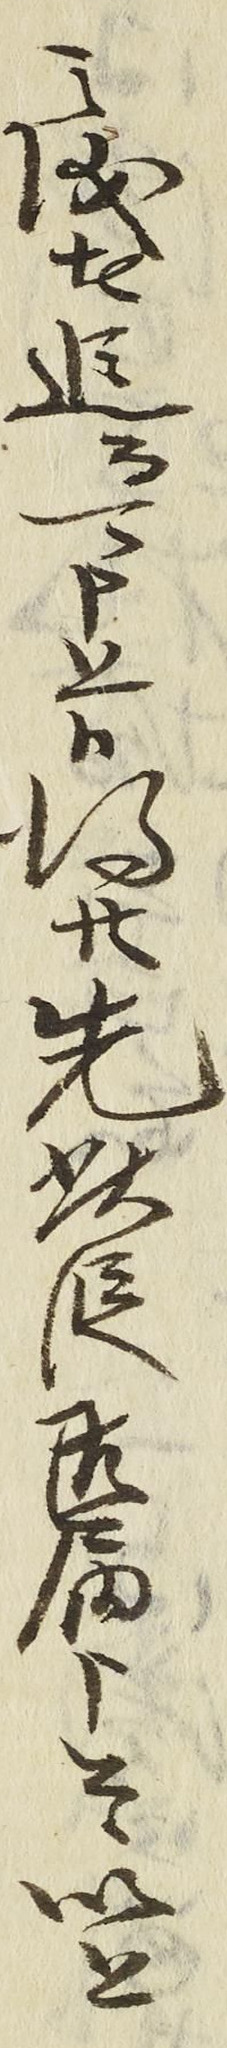之儀は追而可上候得共先此段御届申上候以上
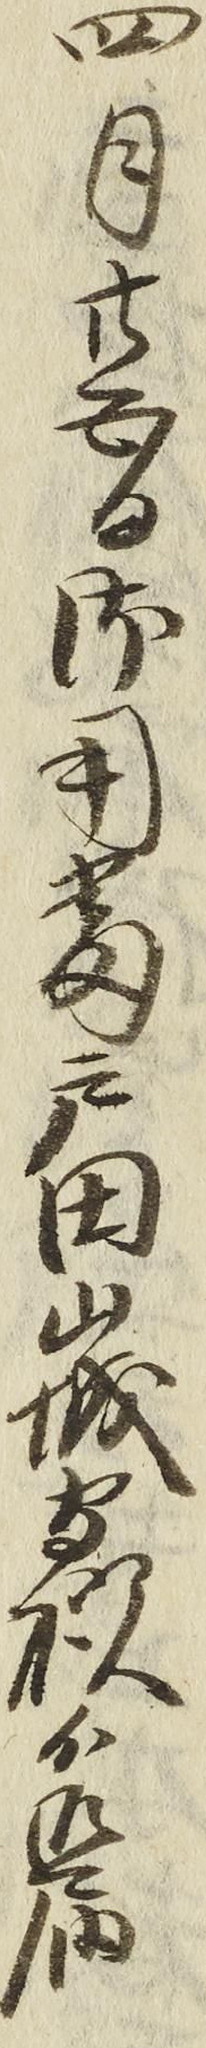四月廿五日御用番戸田山城守様ゟ御届
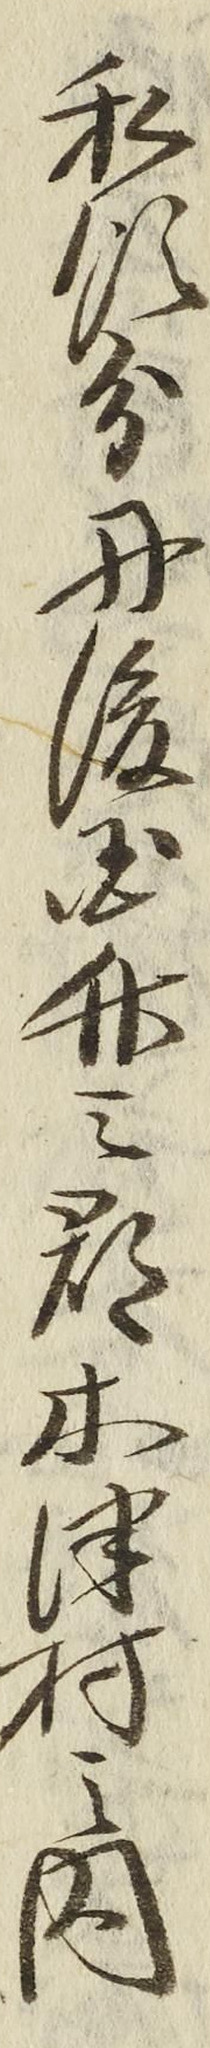私領分丹後国竹之郡木津村之内
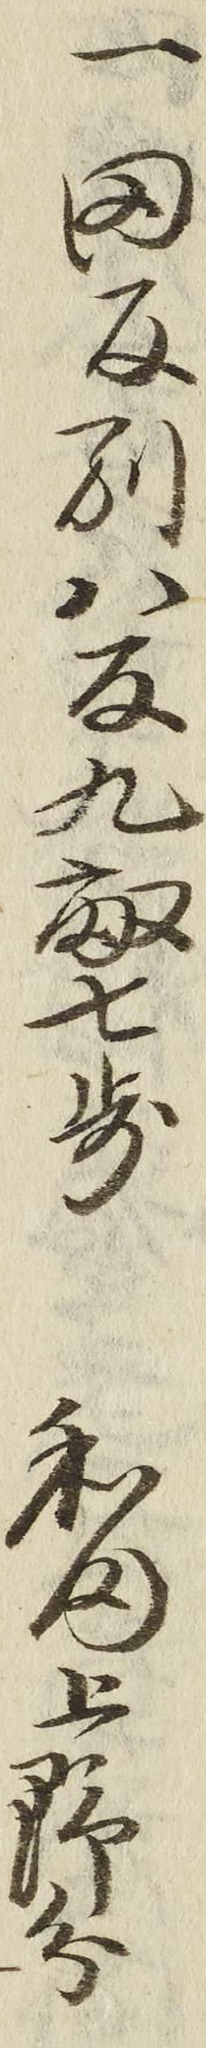一田反別八反九畝七歩和田上野分
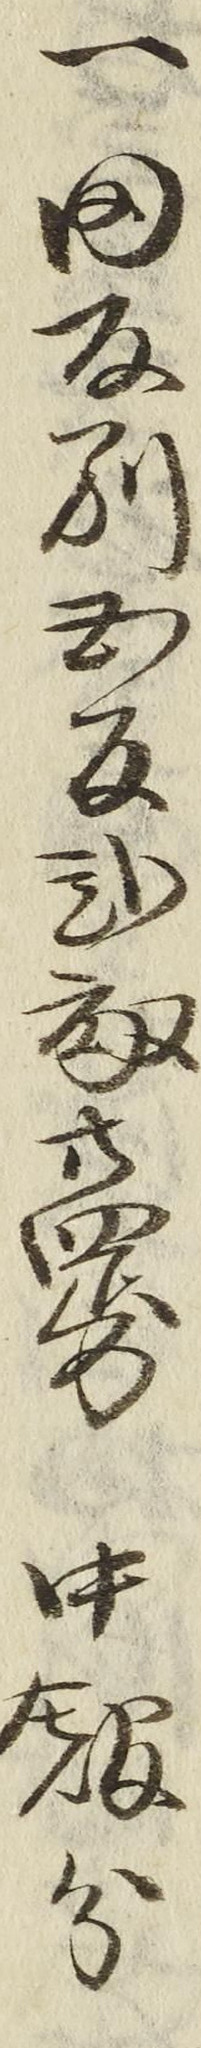一田反別五反弐畝廿四分中館分
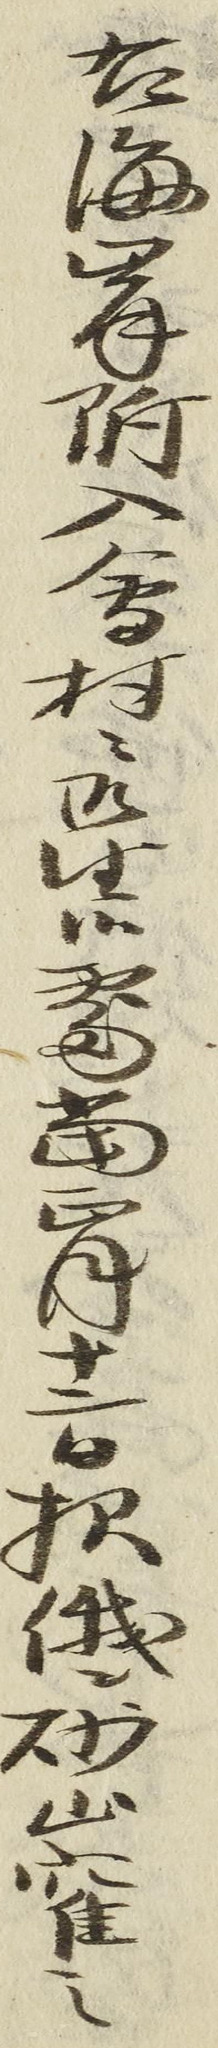右海岸附入会村々御坐候処当正月十二日夜俄二砂山窟之
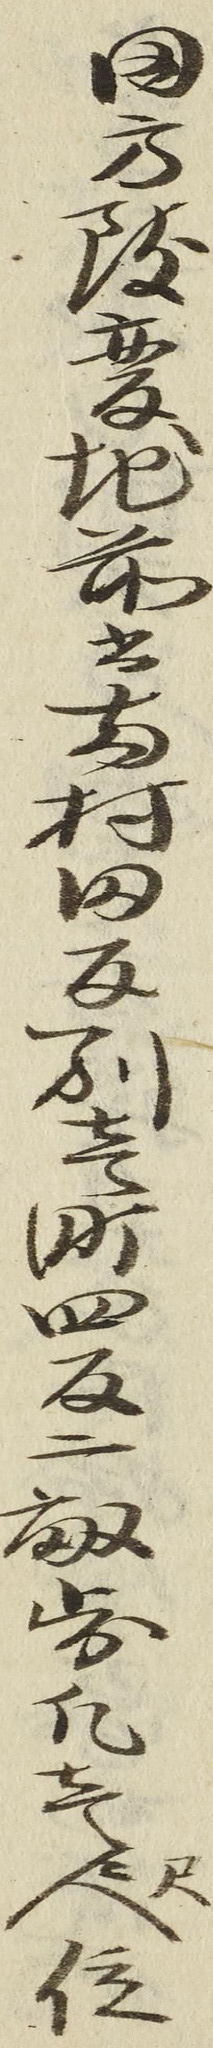田方致変地所は兩村田反別壱町四反弐畝歩凡壱尺位
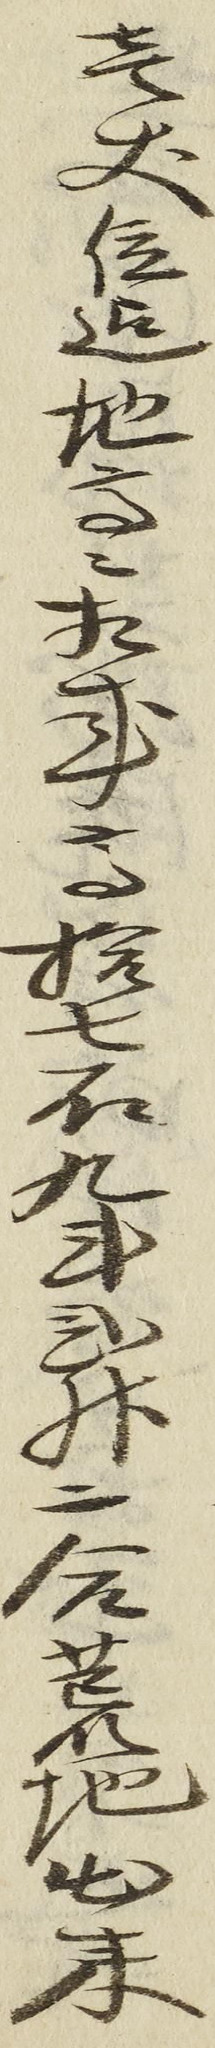壱丈位迄地高二相成高拾七石九斗弐升二合荒地出来
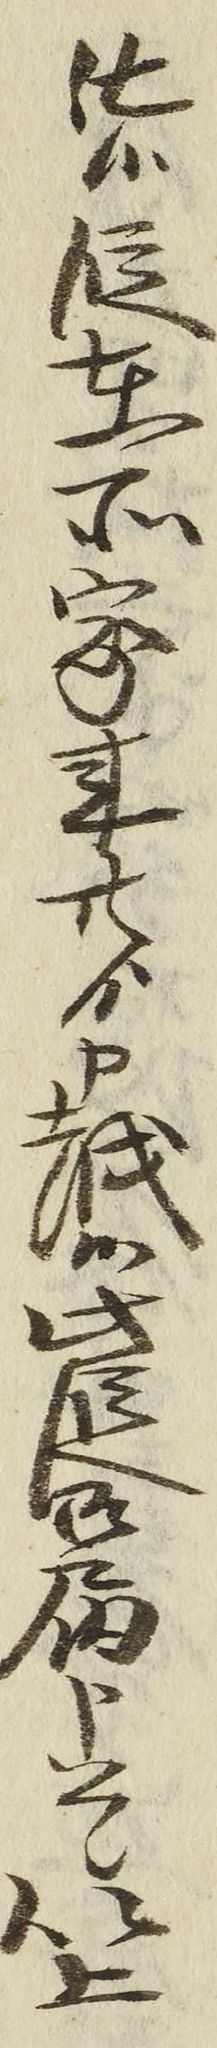仕候段在所家来共ゟ申越候此段御届申上候以上
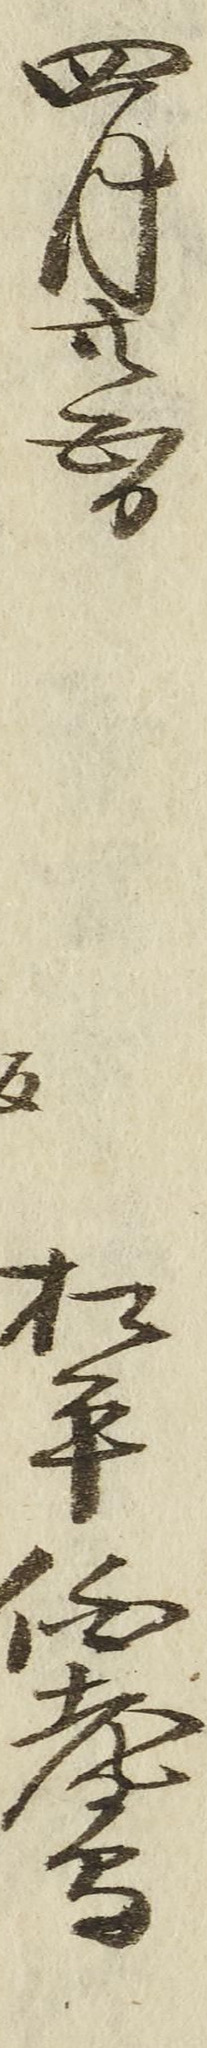四月廿五日松平伯耆守
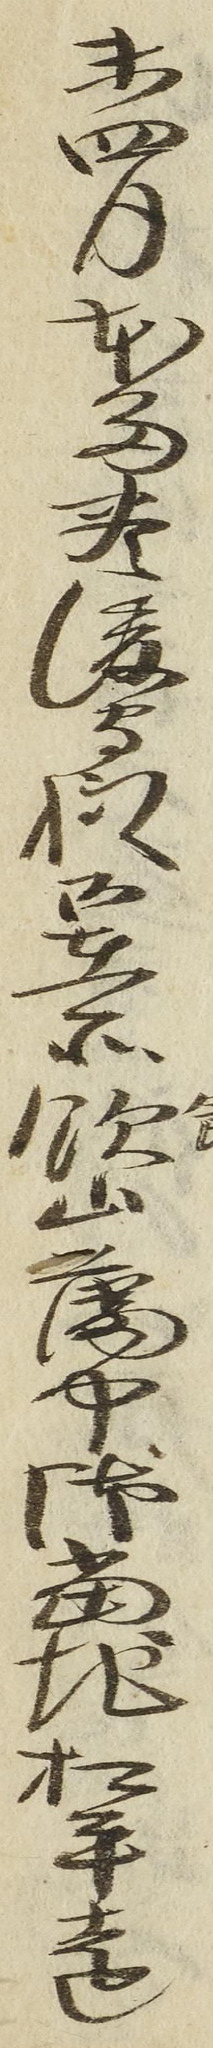未四月本多豊後守様御在所飯山藩中御当地松平遠

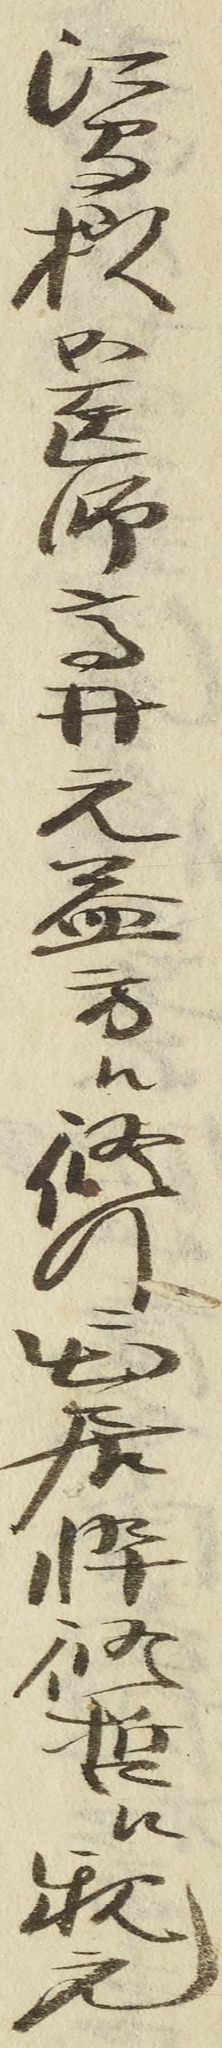江守様御医師高井元益方江修行二出居忰修哲江親元
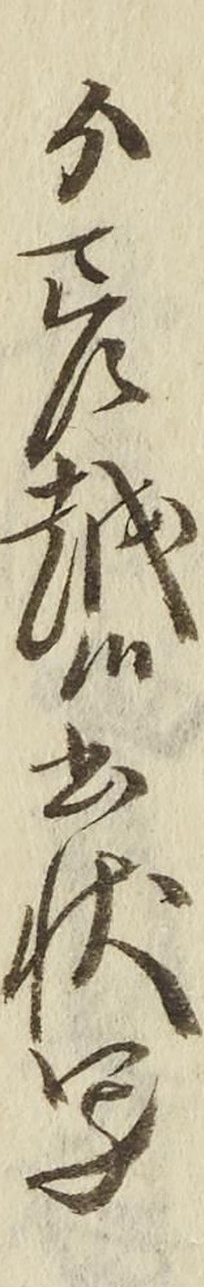ゟ差越候書状写
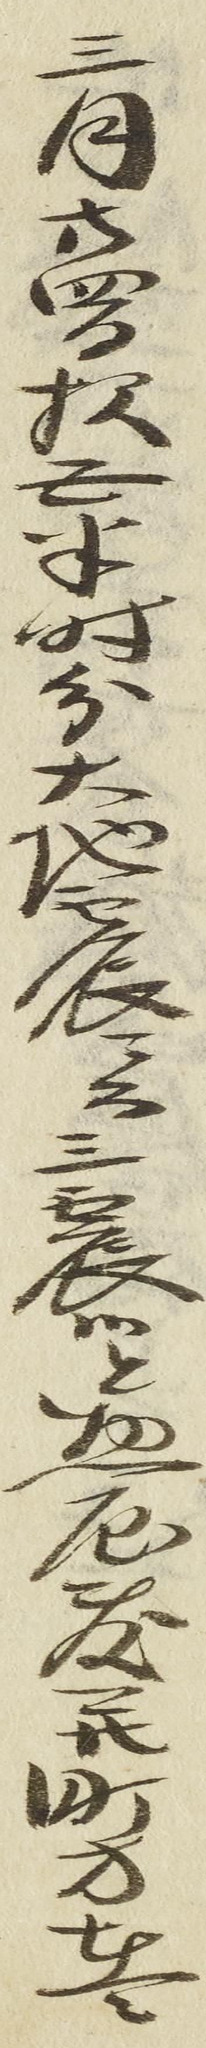三月廿四日夜五半時分大地震二而三震候と惣屋敷并町方在々
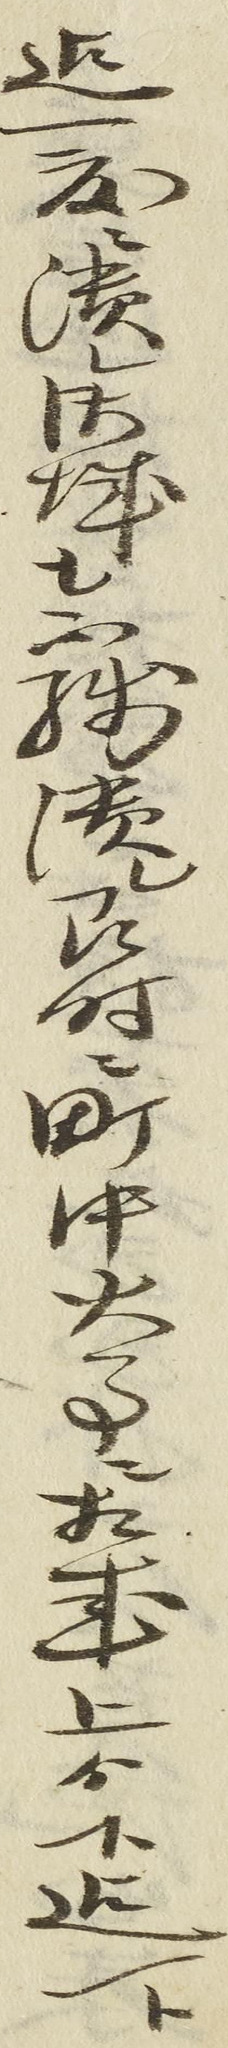迄一度二潰ㇾ御城も不残潰ㇾ即時二町中火事二相成上ゟ下迄一ㇳ
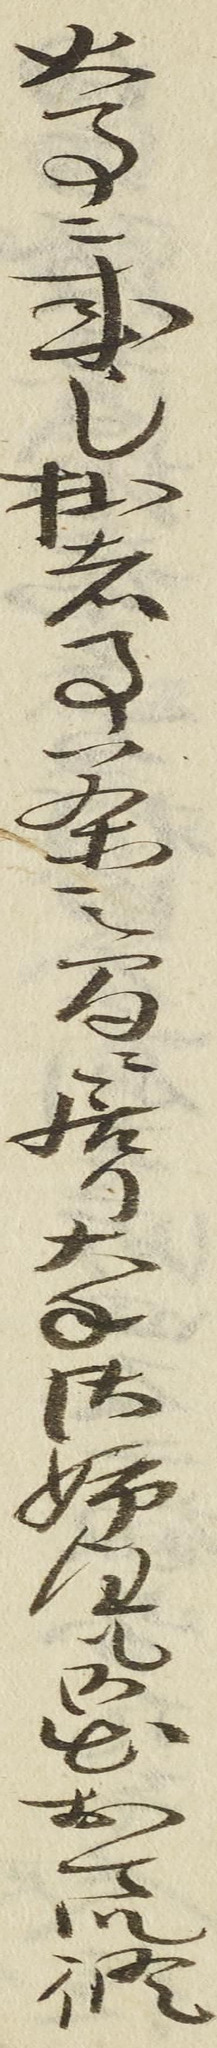火事二成申候拙者事茶之間二居り大手御姉殿も御出おてい修
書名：信濃國大地震記　乾
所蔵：東京大学地震研究所図書室 Earthquake Research Institute Library, The University of Tokyo, JAPAN
